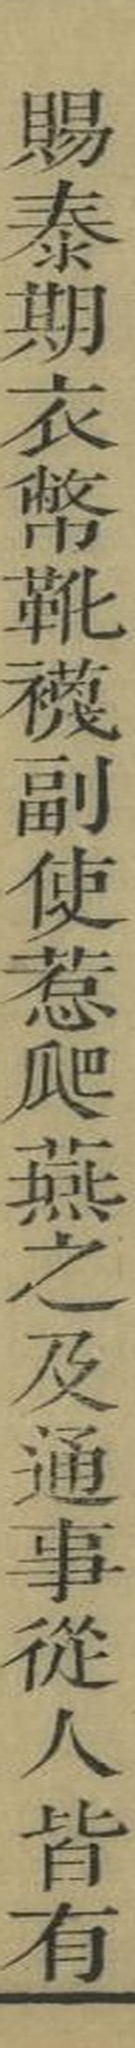賜泰期衣幣靴襪副使惹爬燕之及通事従人皆有
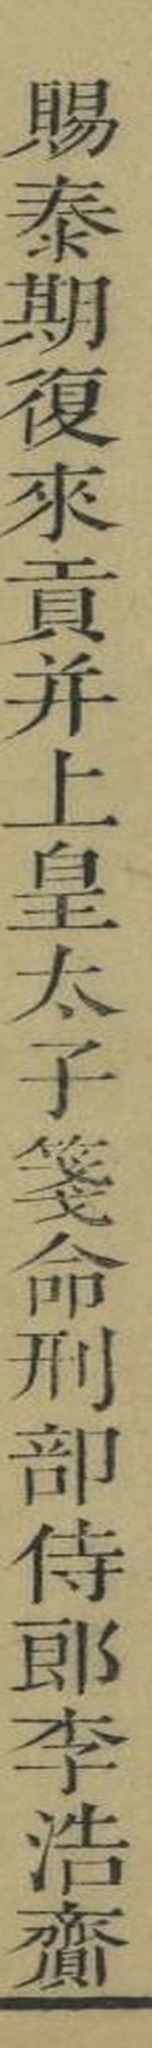賜泰期復来貢并上皇太子箋命刑部侍郎李浩齎
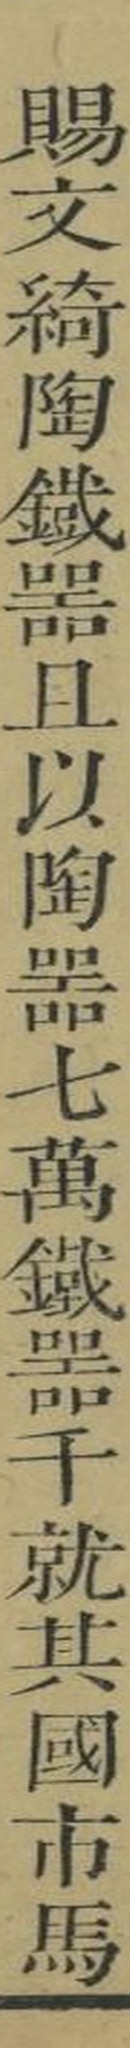賜文綺陶鉄器且以陶器七万鉄器千就其国市馬
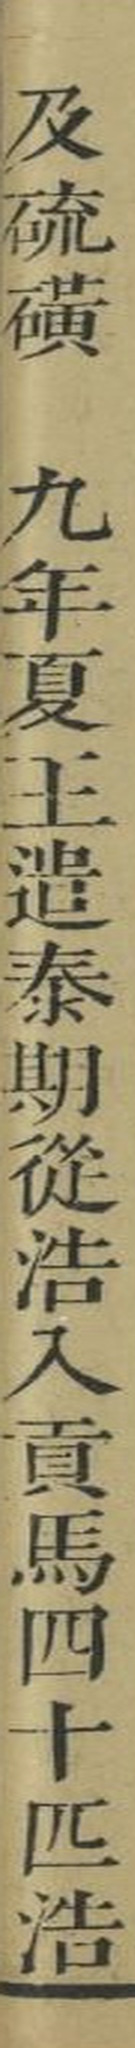及硫磺九年夏王遣泰期従浩入貢馬四十匹浩
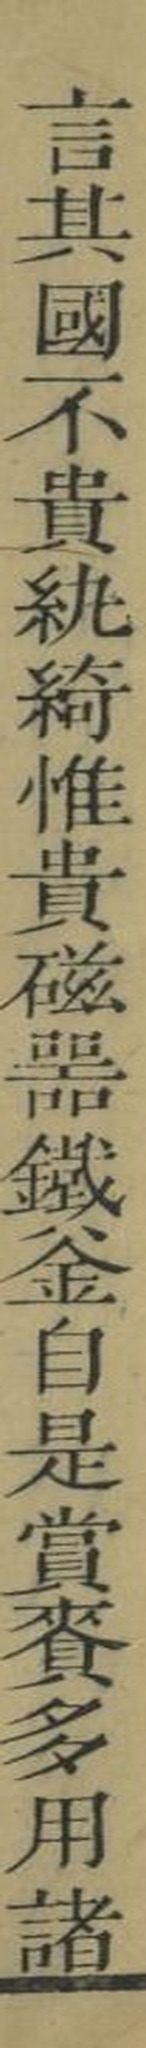言其国不貴紈綺惟貴磁器鉄釜自是賞賚多用諸
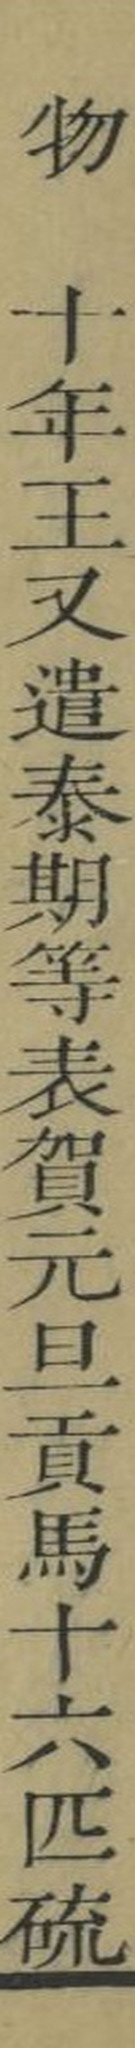物十年王又遣泰期等表賀元旦貢馬十六匹硫
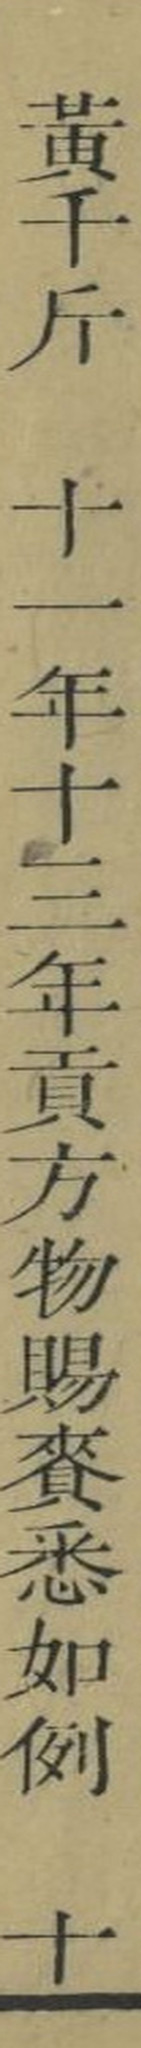黄千斤十一年十三年貢方物賜賚悉如例十
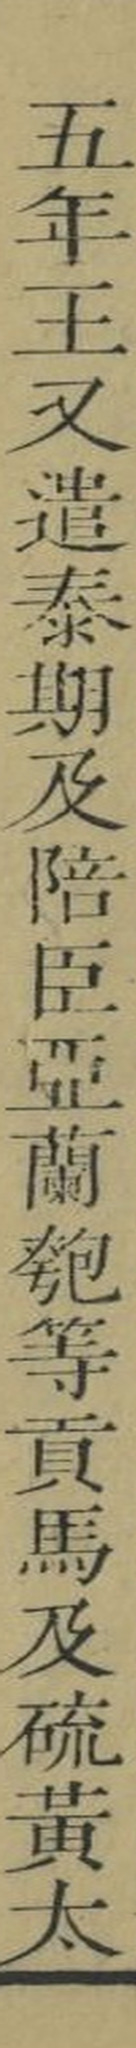五年王又遣泰期及陪臣亜蘭匏等貢馬及硫黄太
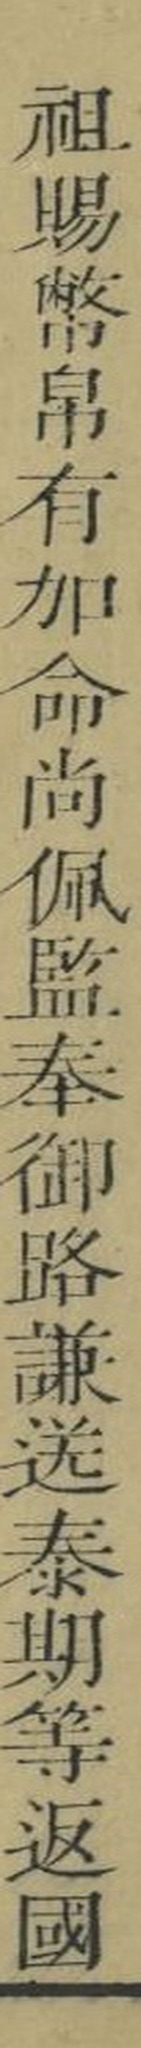祖賜幣帛有加命尚佩監奉御路謙送泰期等返国
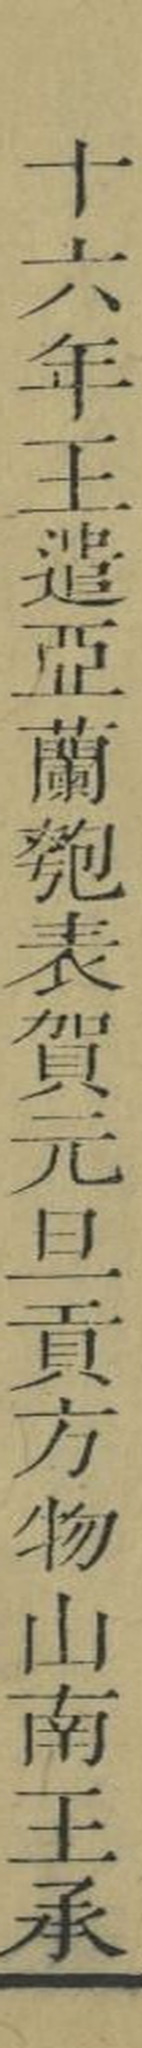十六年王遣亜蘭匏表賀元旦貢方物山南王承
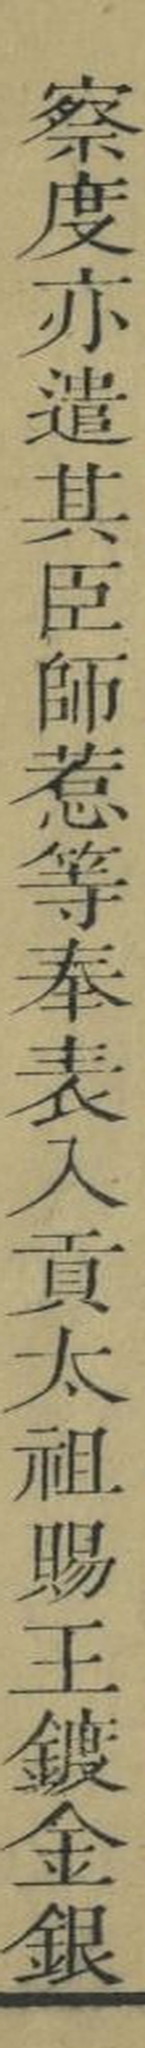察度亦遣其臣師惹等奉表入貢太祖賜王鍍金銀
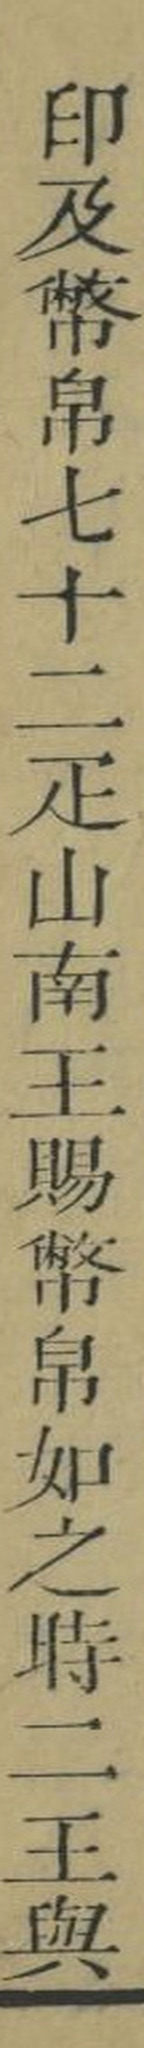印及幣帛七十二疋山南王賜幣帛如之時二王与
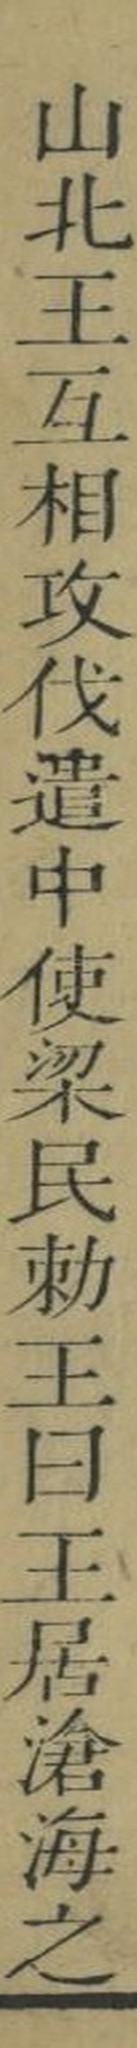山北王互相攻伐遣中使梁民勅王曰王居滄海之

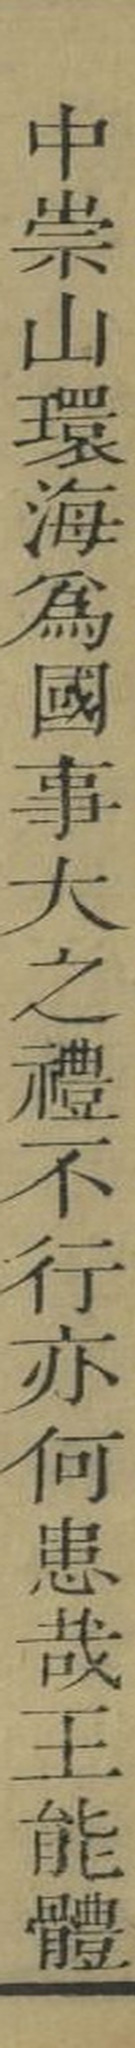中崇山環海為国事大之礼不行亦何患哉王能体
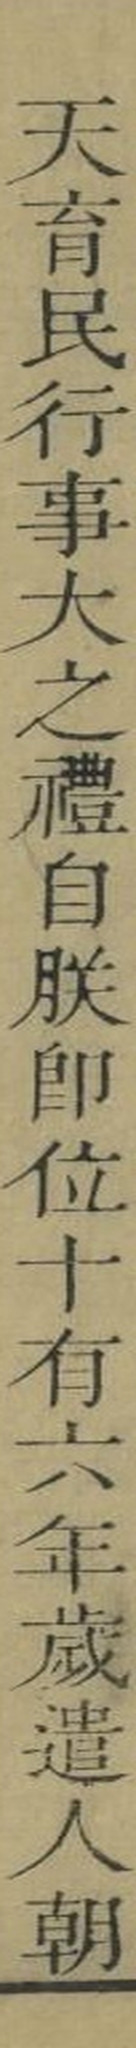天育民行事大之礼自朕即位十有六年歳遣人朝
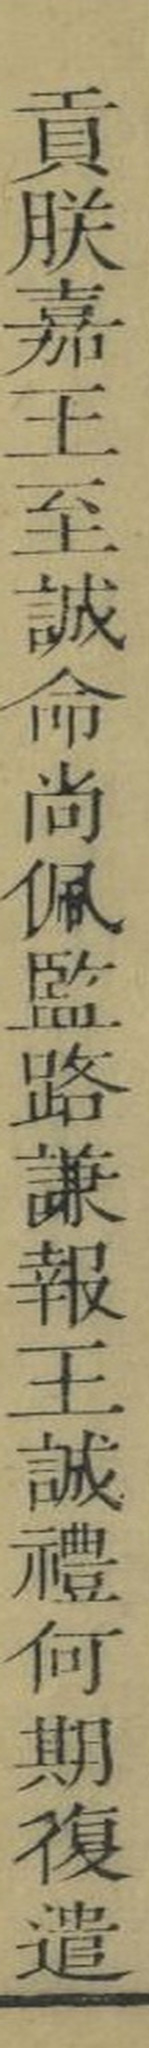貢朕嘉王至誠命尚佩監路謙報王誠礼何期復遣
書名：中山伝信録 巻三
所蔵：University of the Ryukyus Library
